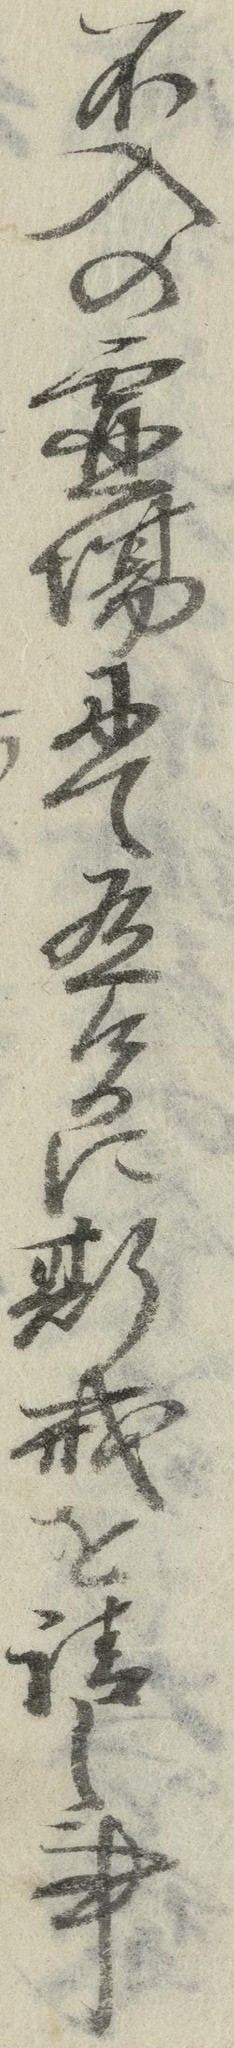不入の霊場にて有けるに斯戒を請し事
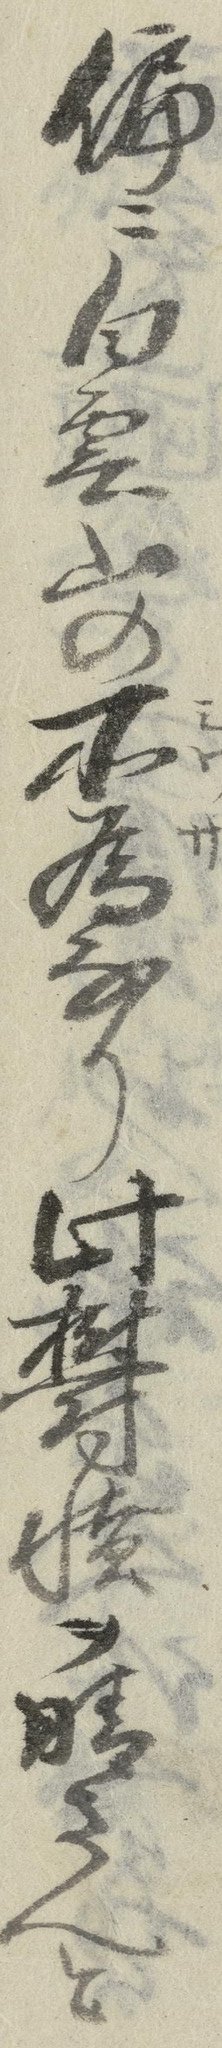偏に白雲山の所為なり此鬱憤を晴さんと
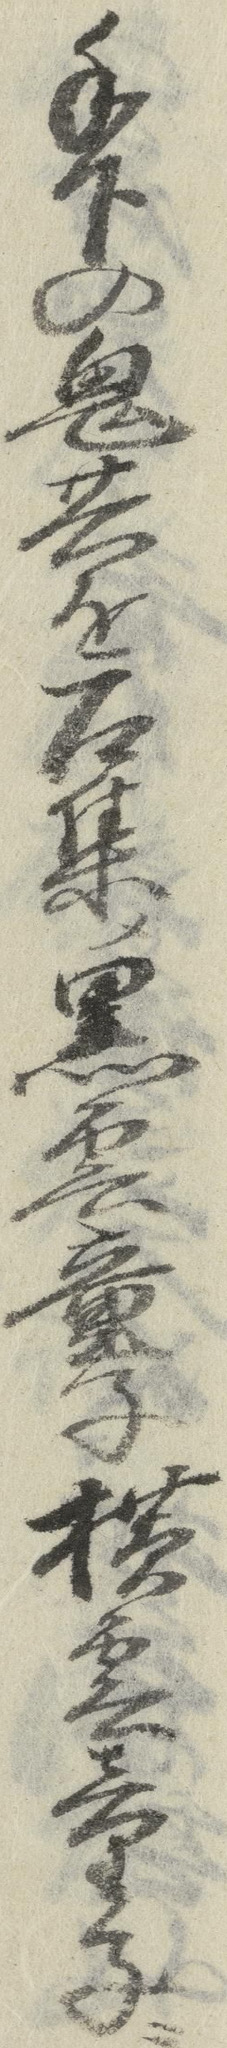手下の鬼共を召集黒雲童子横雲童子に
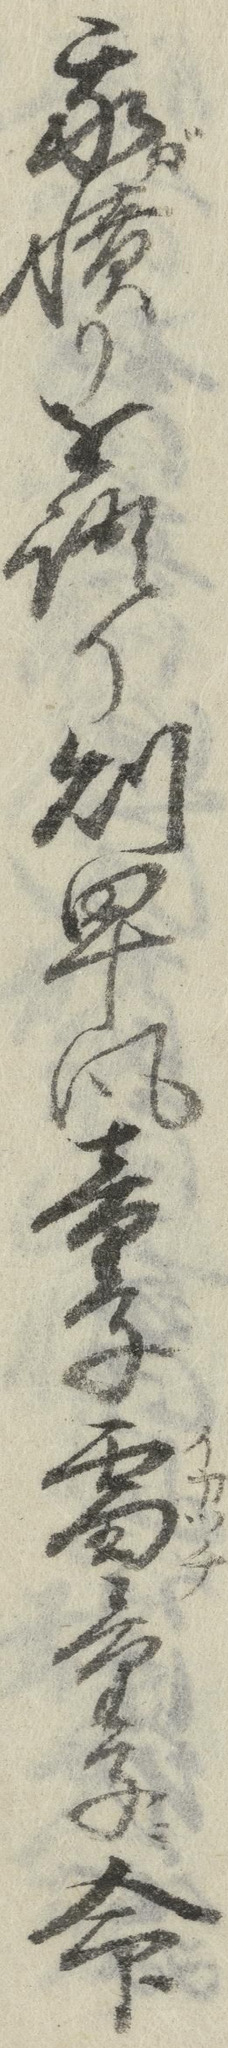我憤りを語り則卑風童子雷童子に命
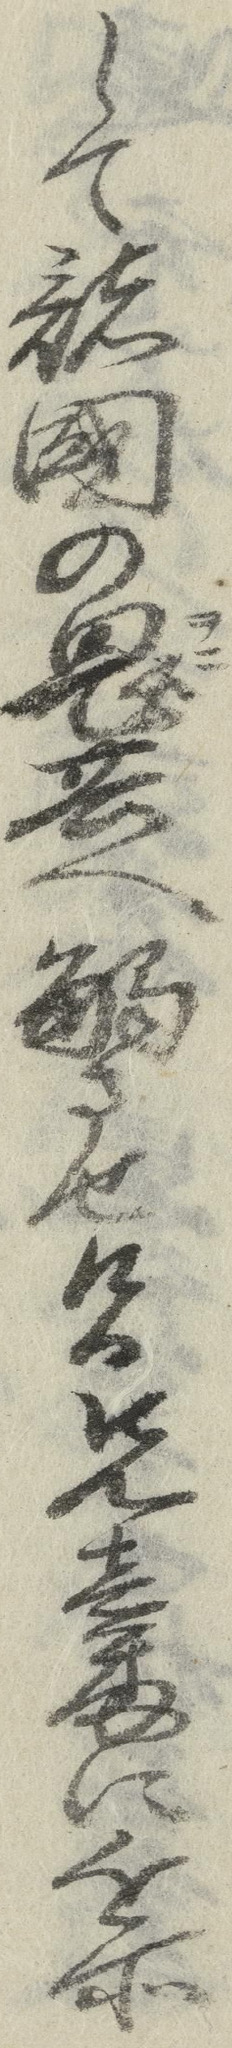して諸国の鬼共へ觸させける先壱番に近所
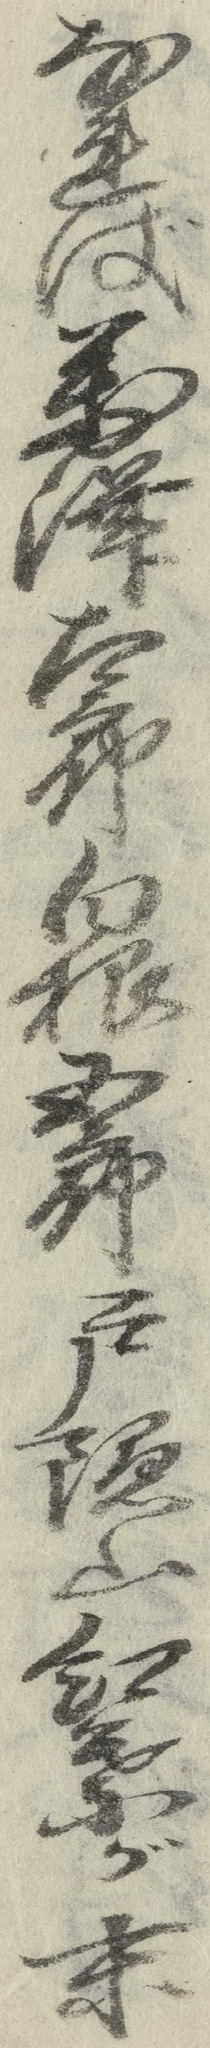なれば万澤太郎白根五郎戸隠山紅葉末
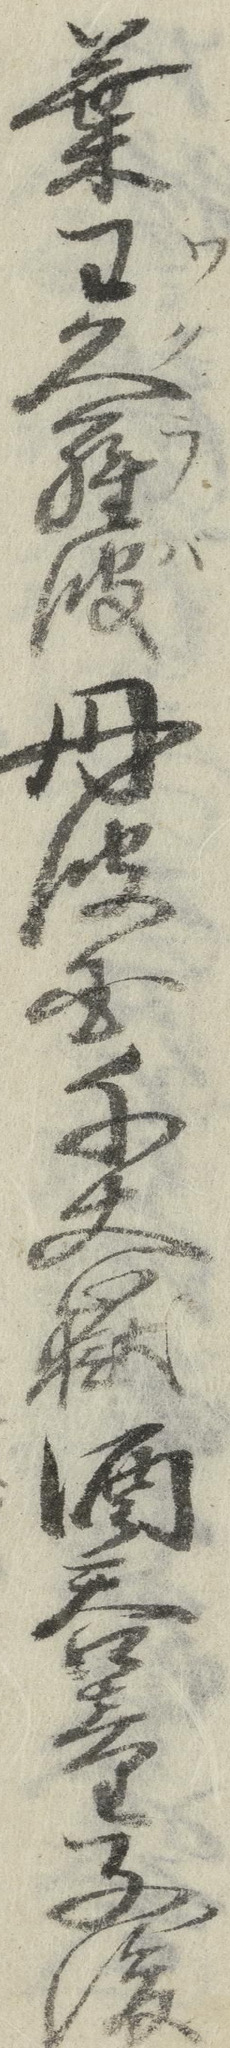葉王久羅破丹波国千丈嶽酒呑童子後
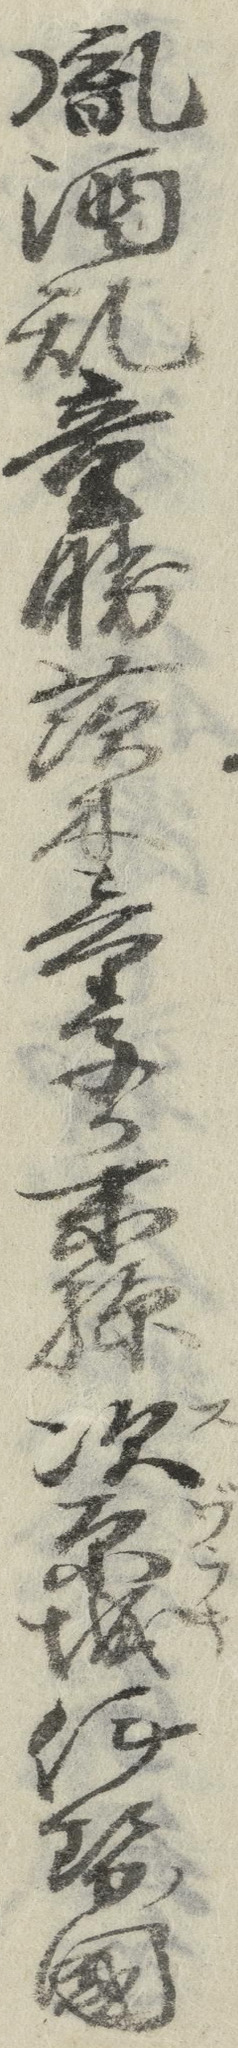胤酒乱童勝茨木童子か末孫次原城伊勢国
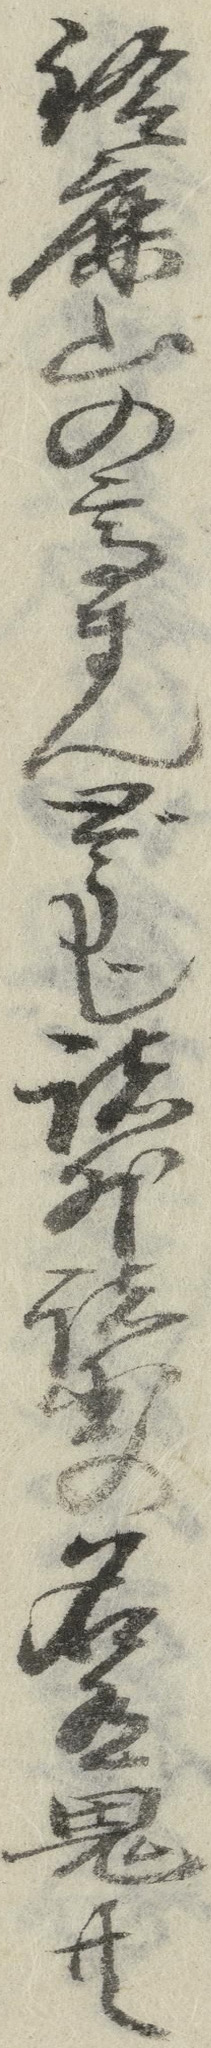鈴鹿山の高まんどうじ諸外諸国の名有鬼共
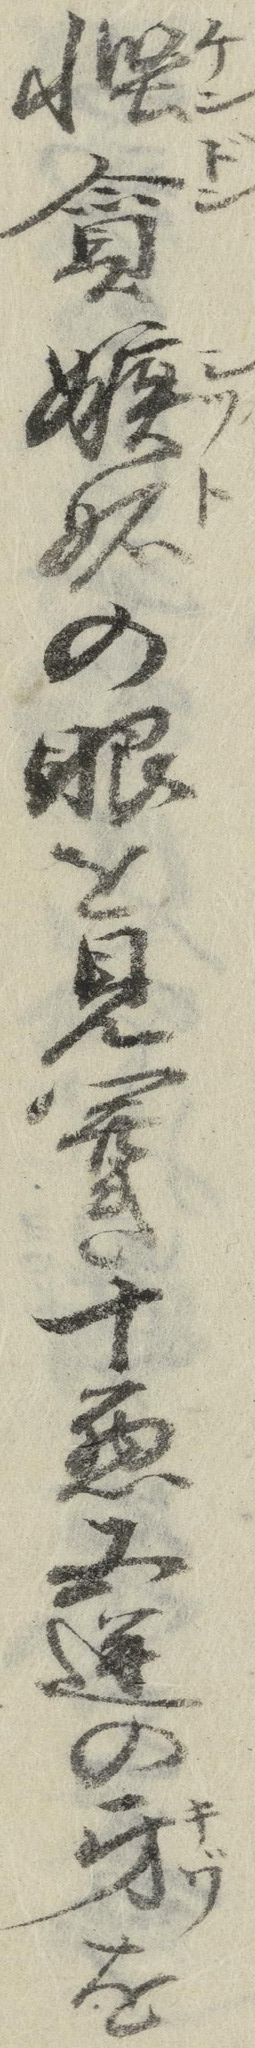慳貪嫉妬の眼を見開き十悪五逆の牙を

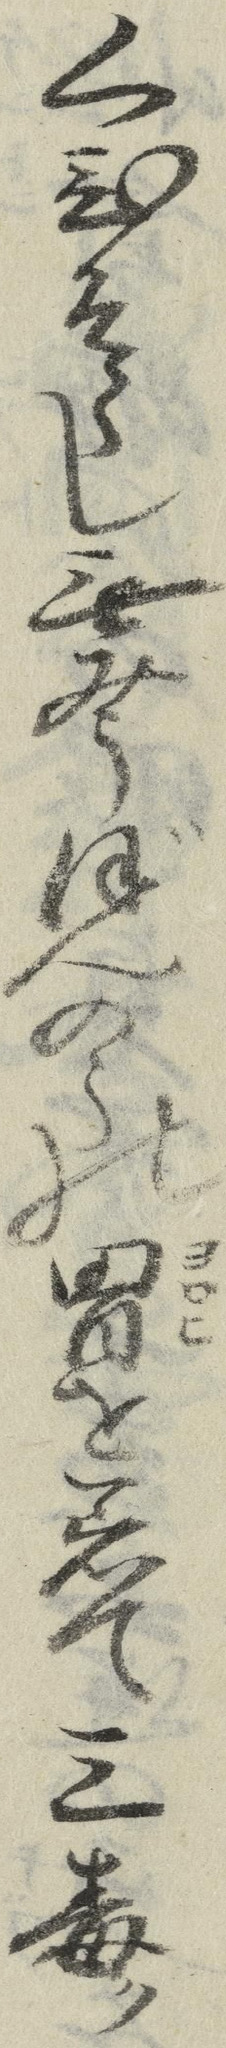くひそらし無みうぼんのうの冑を着て三毒
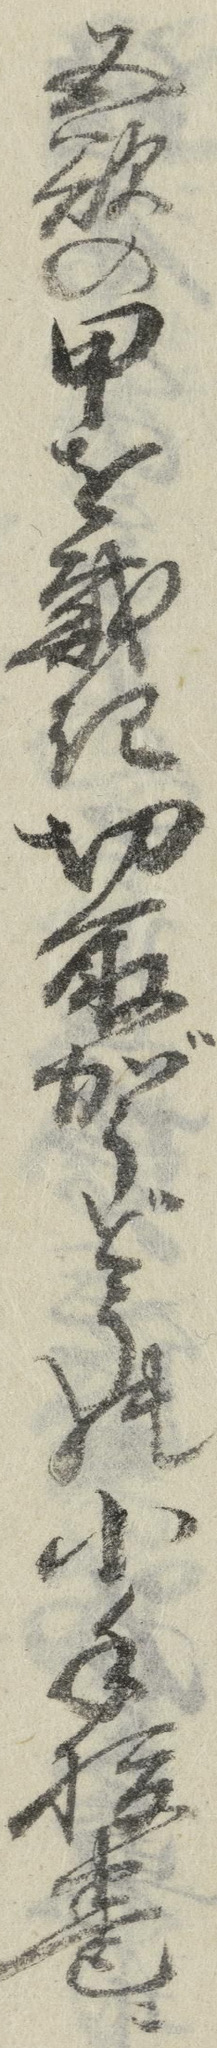五欲の甲を戴き切取がうどうの小手腹巻に
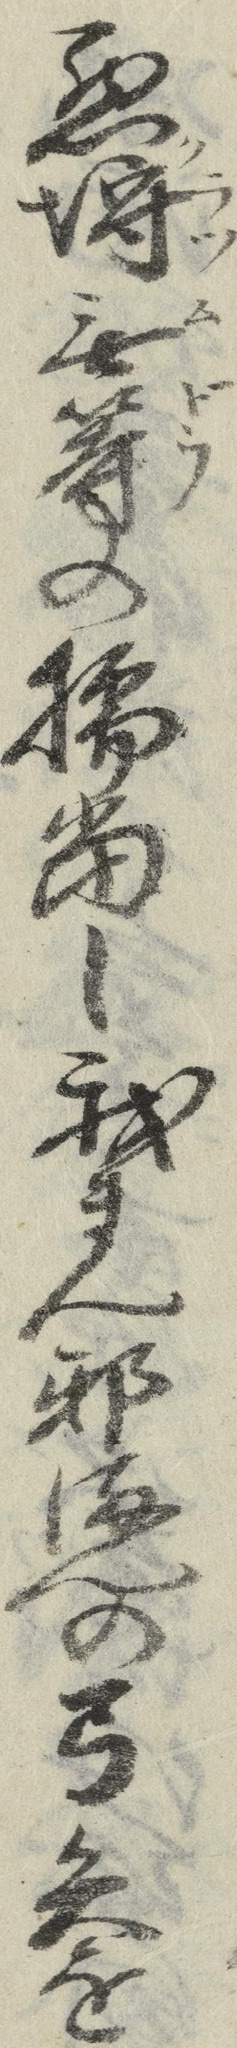悪垨無等の臑当し我まん邪まんの弓矢を
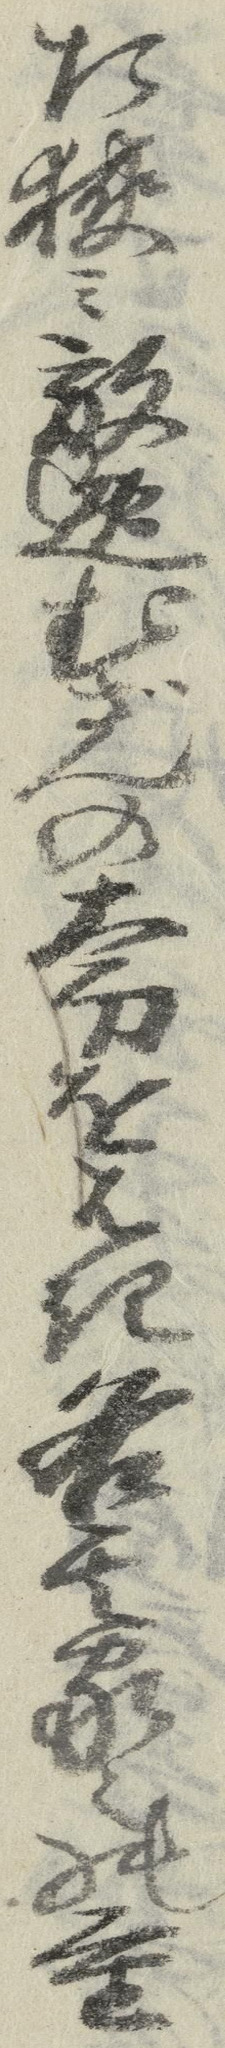た挟放逸むざんの太刀をはき各其我々の重
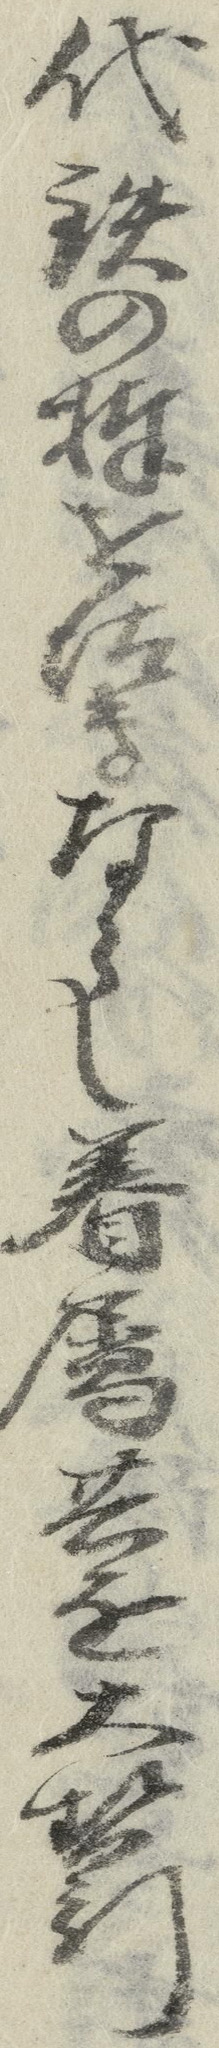代鉄の捧をつきならし眷属共を大勢引
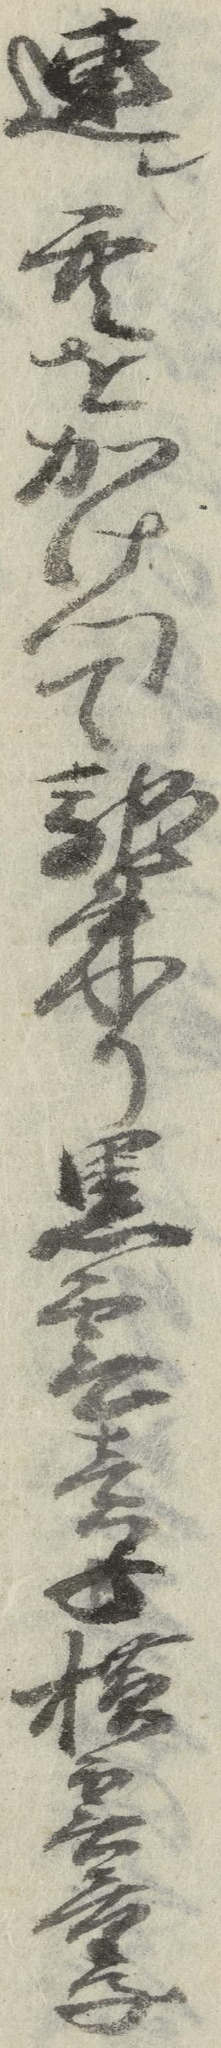連空をかけつて馳来り黒雲童子横雲童子
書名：浅間大焼騒動記　上
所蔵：東京大学地震研究所図書室 Earthquake Research Institute Library, The University of Tokyo, JAPAN
